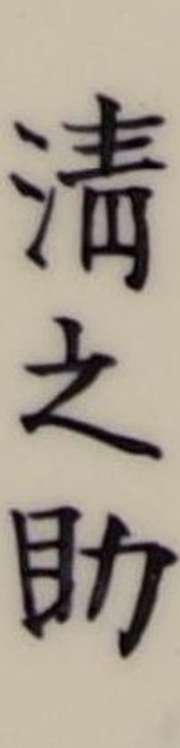清之助
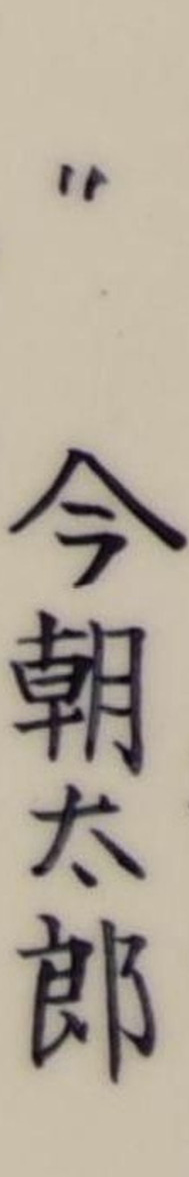今朝太郎
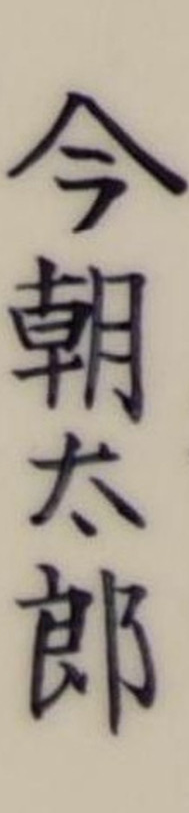今朝太郎
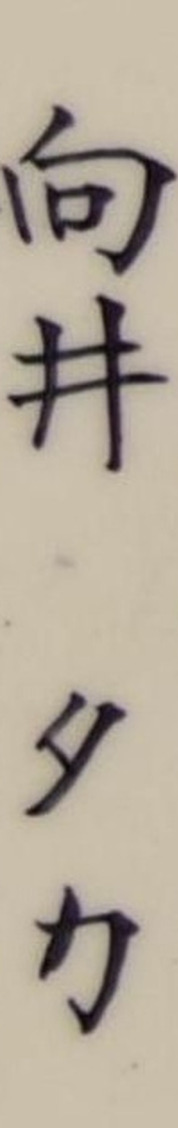向井夕カ
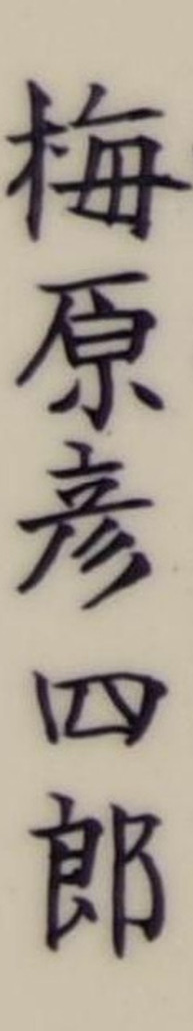梅原彦四郎
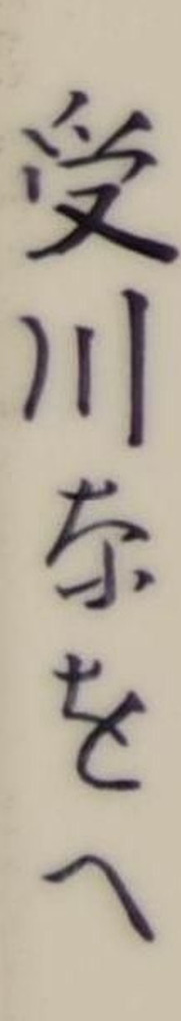受川なをへ

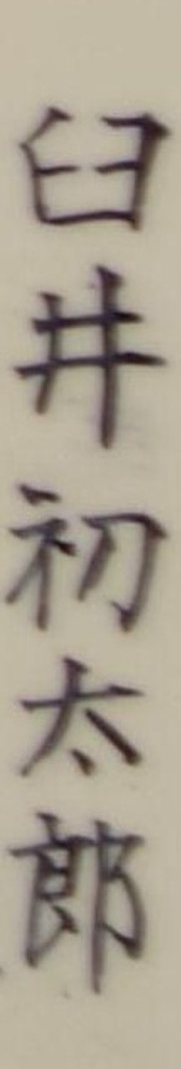臼井初太郎
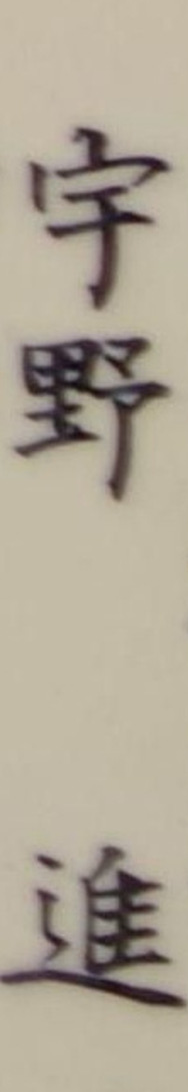宇野進
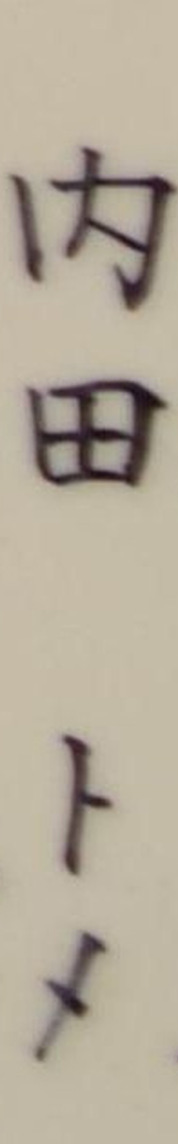内田トメ
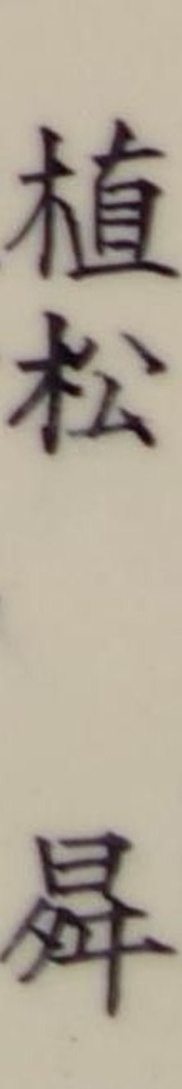植松昇
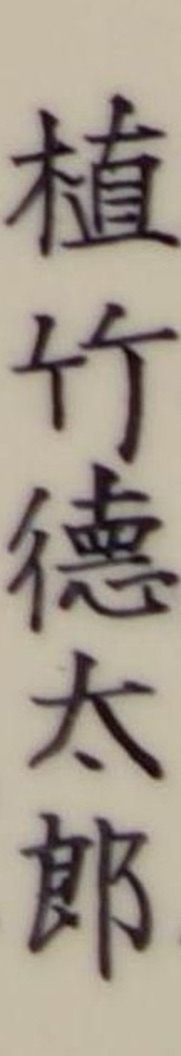植竹徳太郎
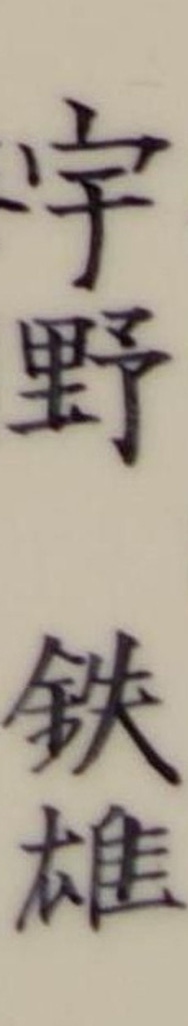宇野鉄雄
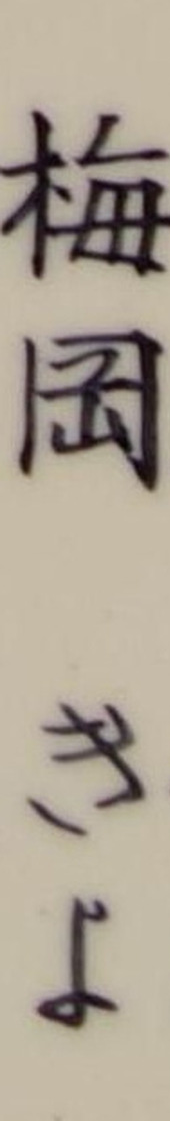梅岡きよ
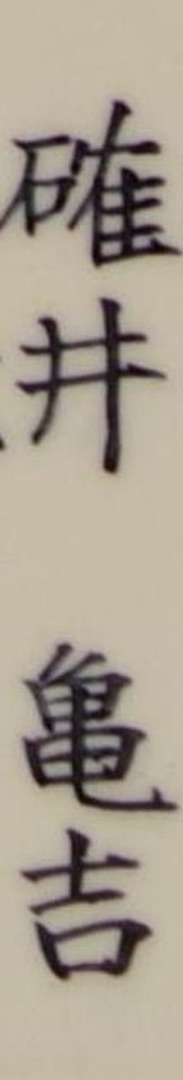碓井亀吉
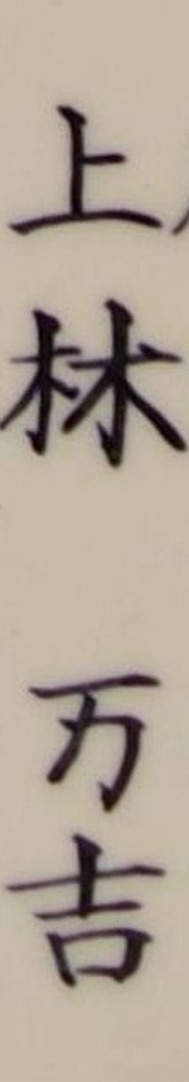上林万吉
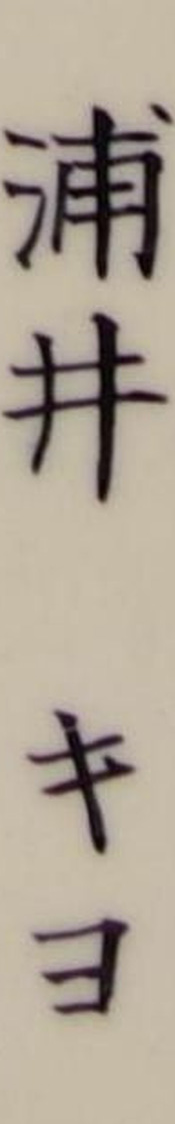浦井キヨ
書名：M~S
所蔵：高野山金剛峯寺
